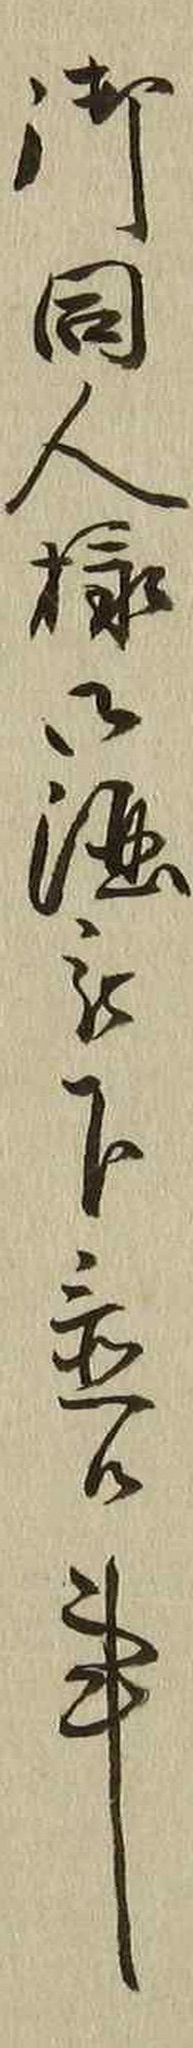御同人様御酒被下置候事
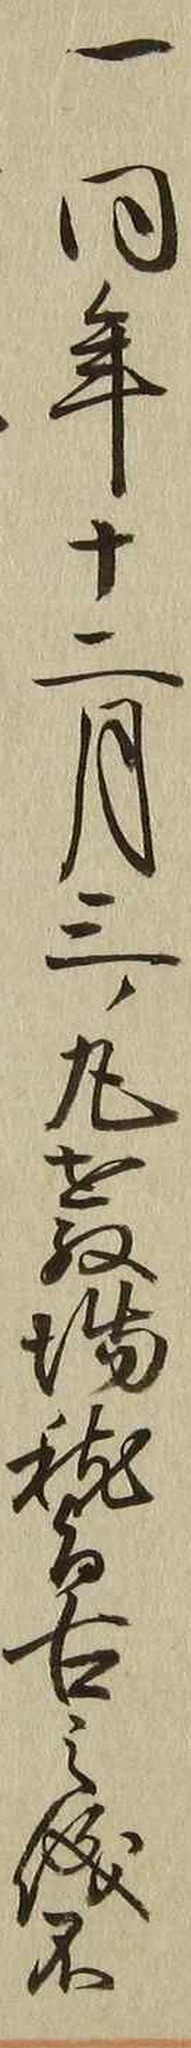一同年十二月三ノ丸教場稽古之儀不
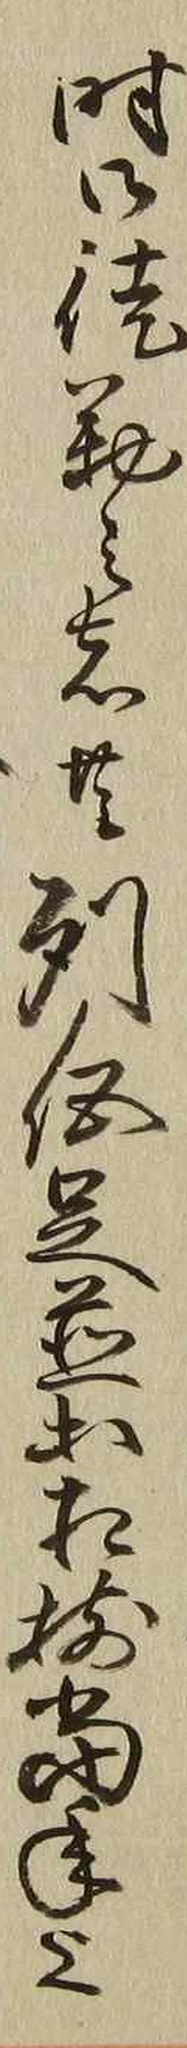時御徒勤之者共列伍足並等相揃当年上
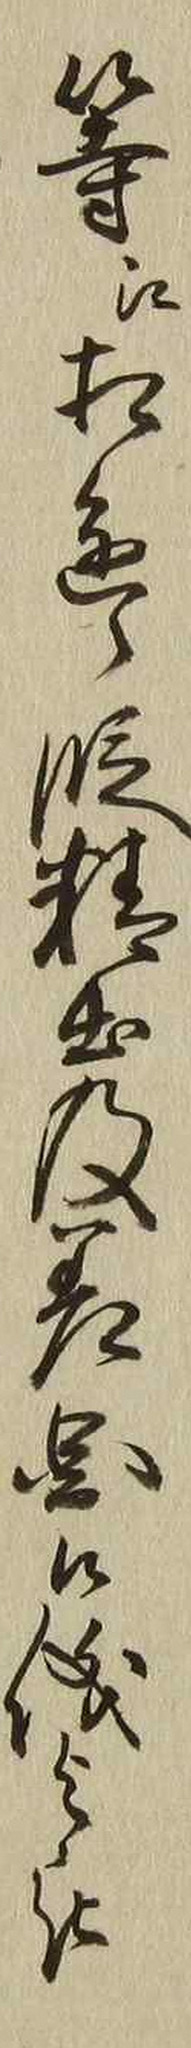等江相進候段精出及差図候儀与被
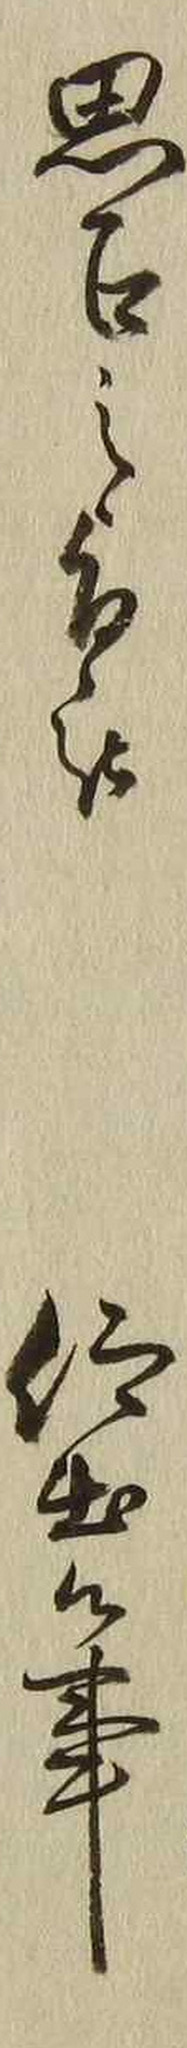思召之候旨被仰出候事
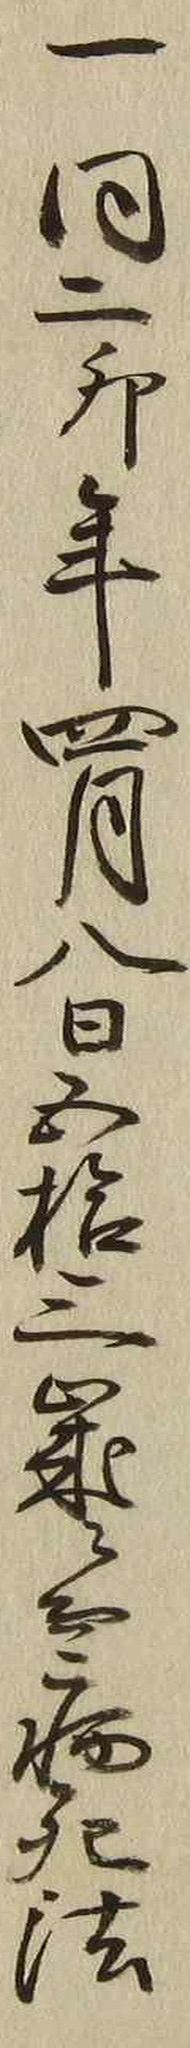一同二卯年四月八日五拾三歳ニ而病死法
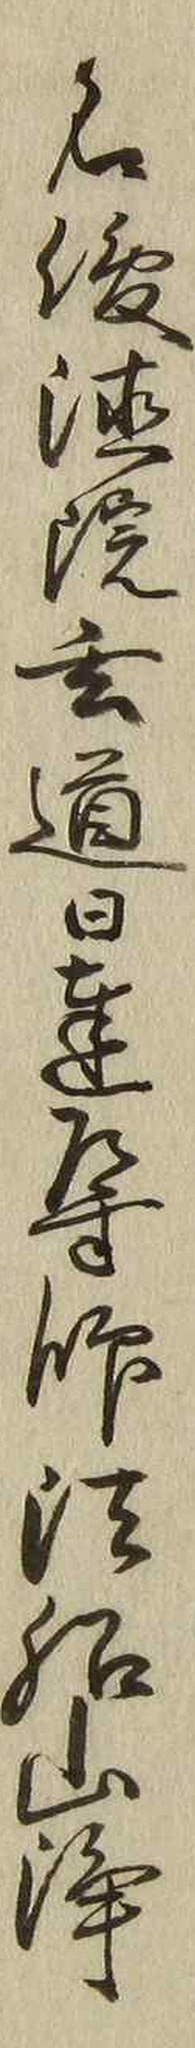名後徳院玄道日達導師法紹山浄
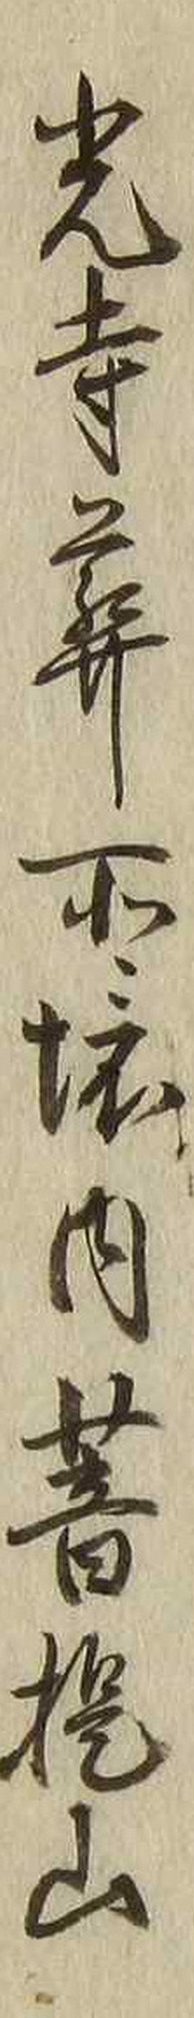光寺葬所境内菩提山

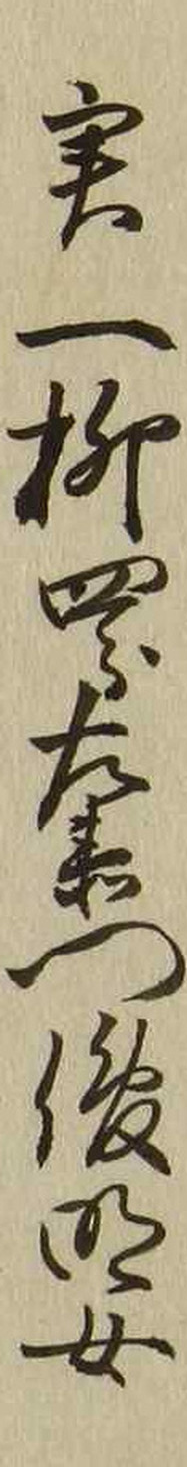実一柳四郎左衛門俊明女
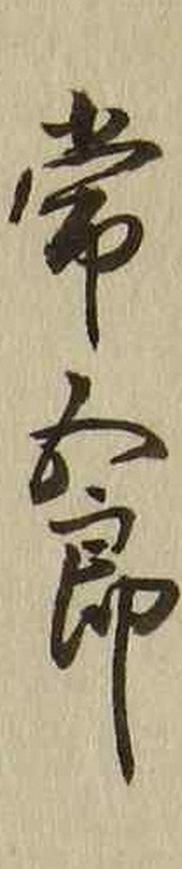常五郎
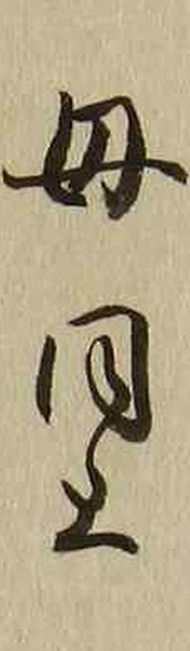母同上
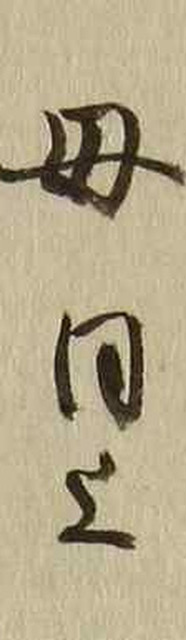母同上
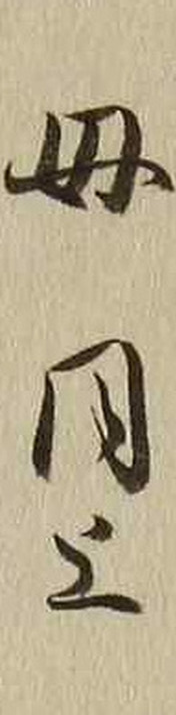母同上
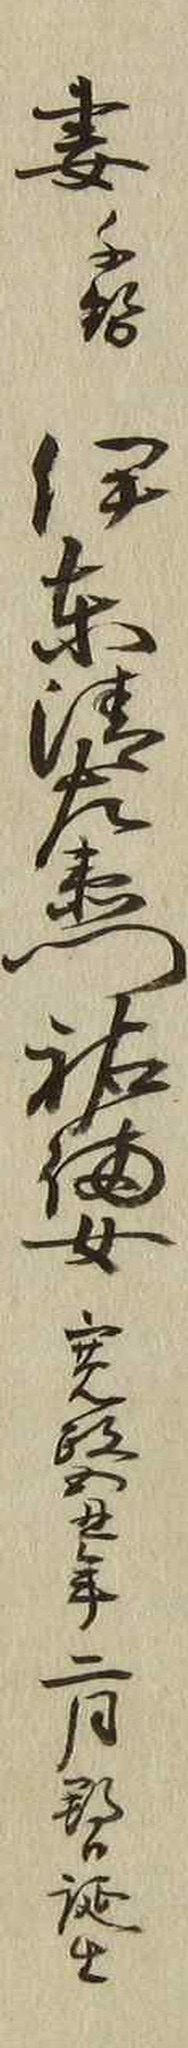妻千勢伊東清左衛門祐備女寛政五丑年二月朔日誕生
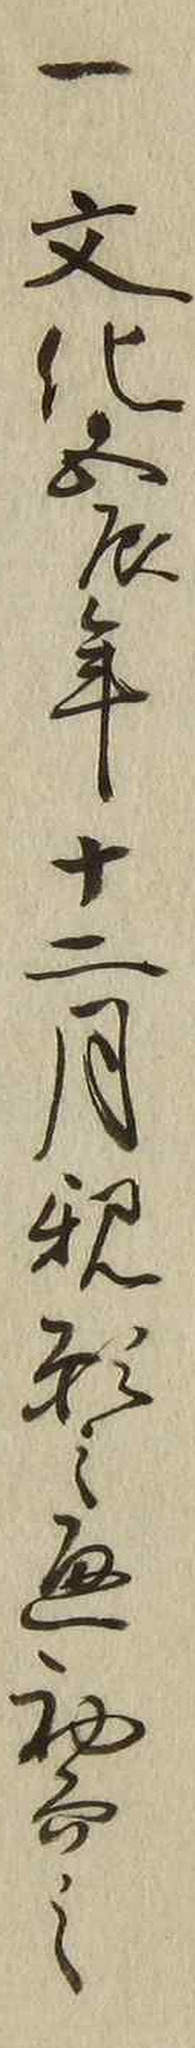一文化五辰年十二月親願之通初而之
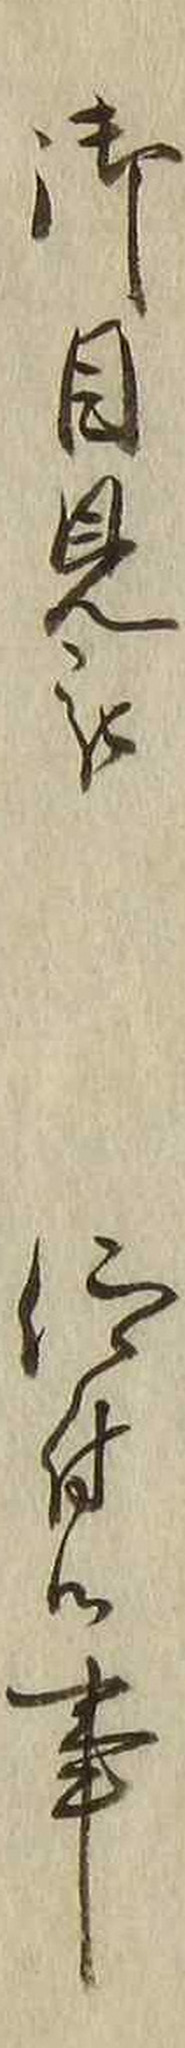御目見被仰付候事
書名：諸士系譜　巻之60　と之部3
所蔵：会津若松市立会津図書館
